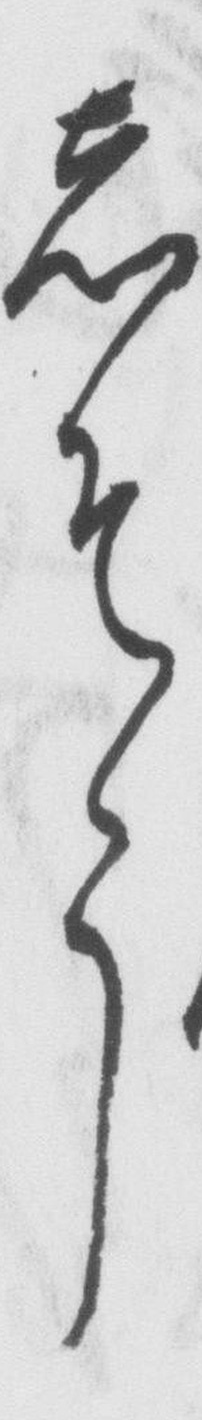ゑそう

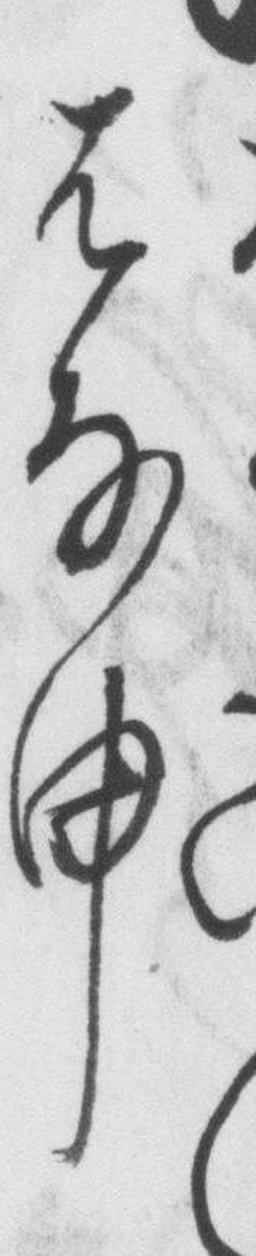はなゆ
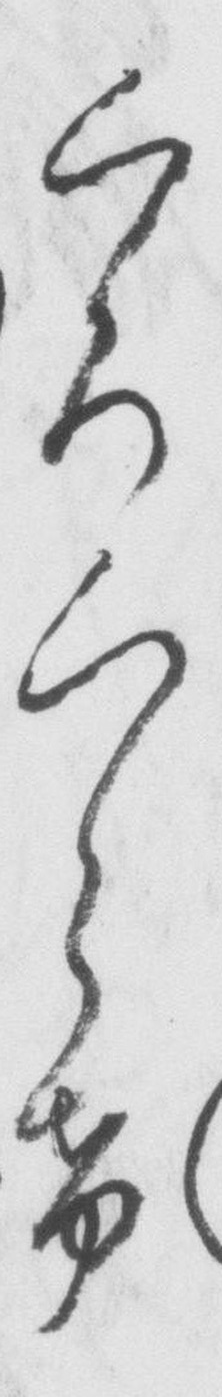くろくらけ

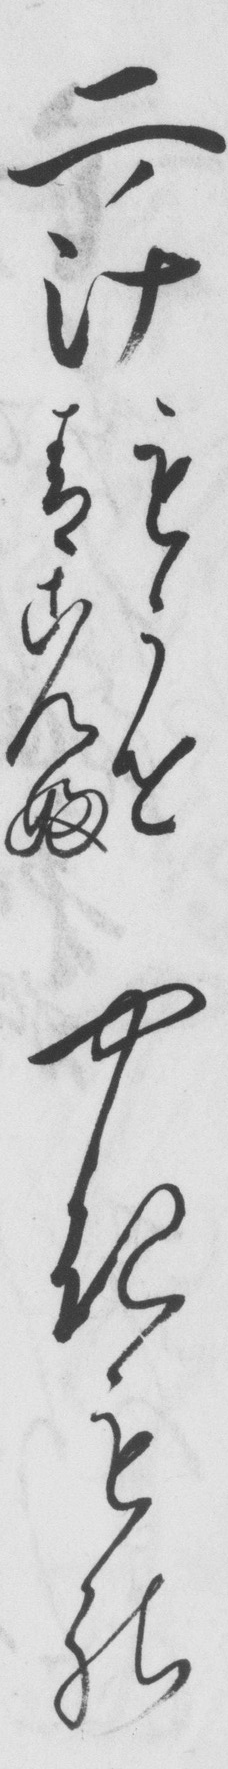二ノ汁もうをやきもの
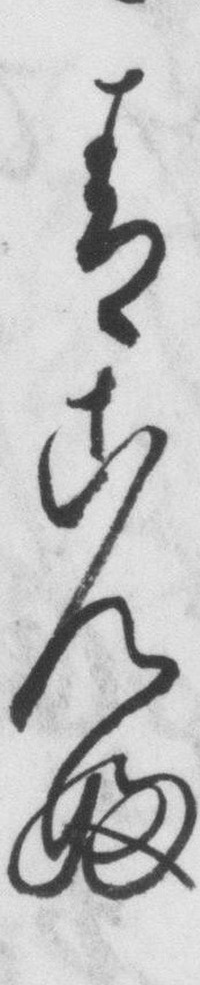青こんふ
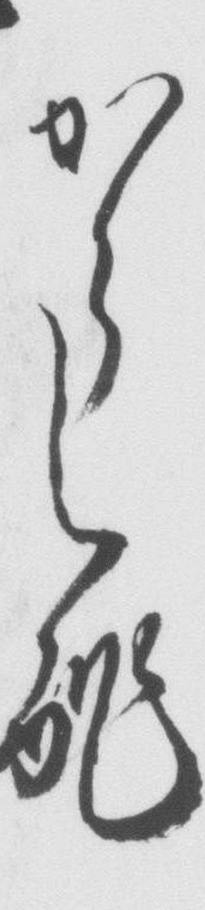からし酢
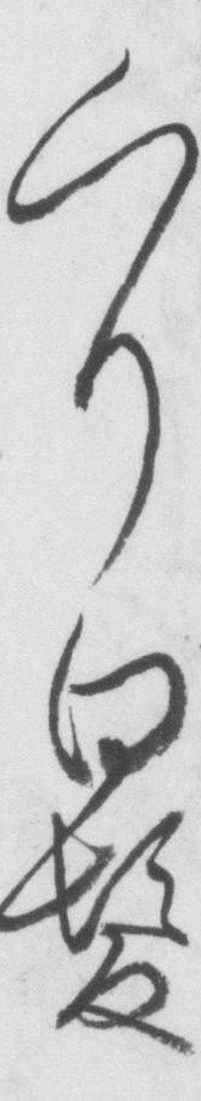くり白髪
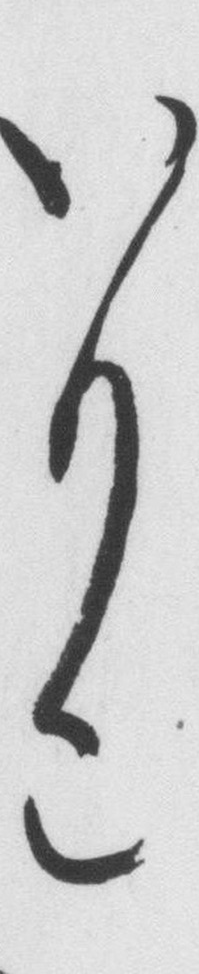いりこ
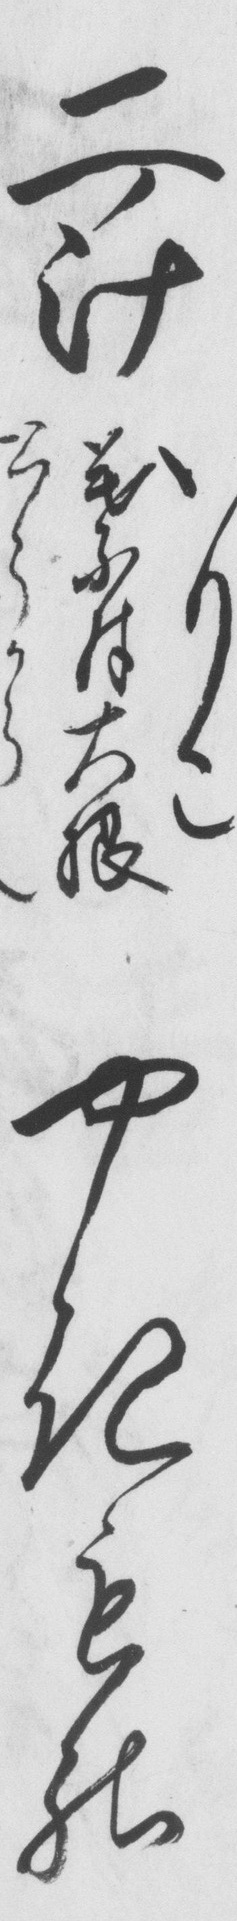二ノ汁葉付大根やきもの
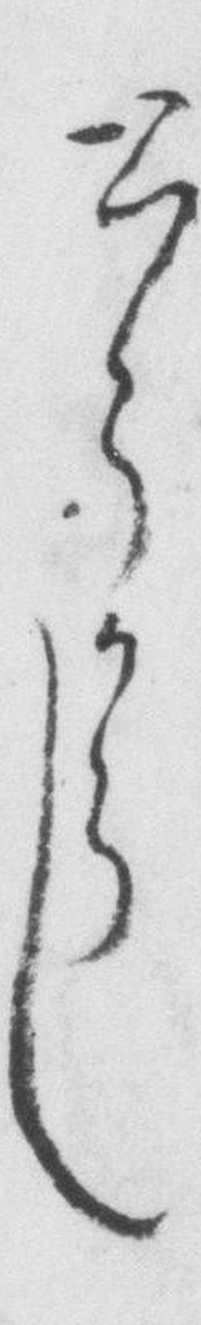とうからし

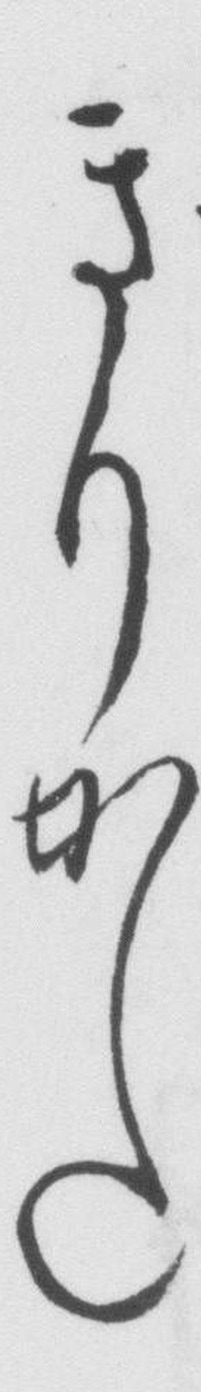きりかた
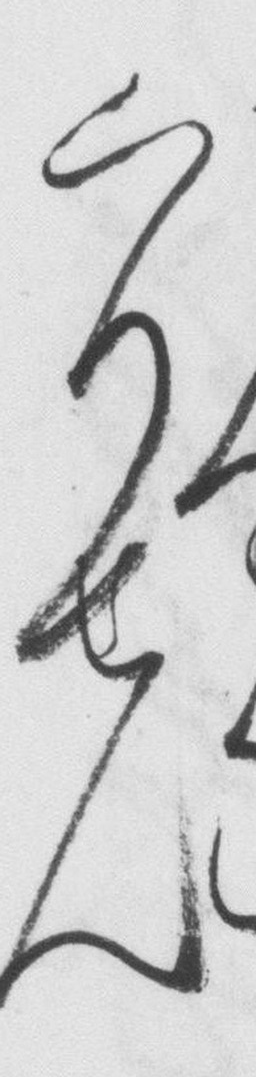くりせん
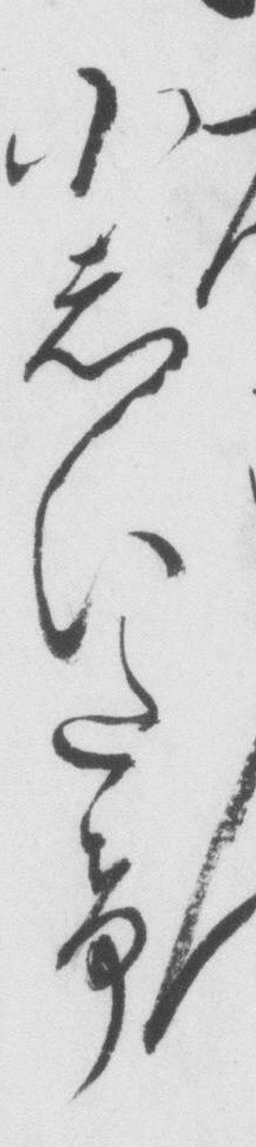小しいたけ
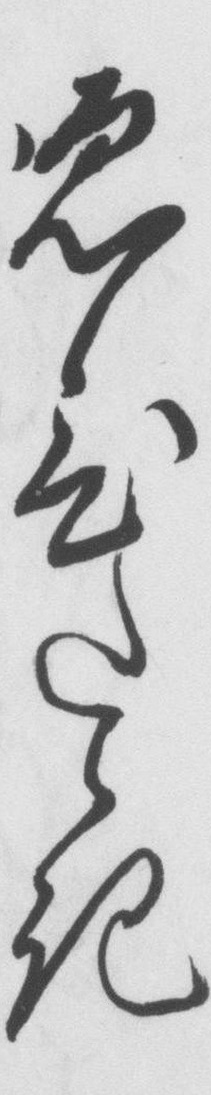ゑひたゝき
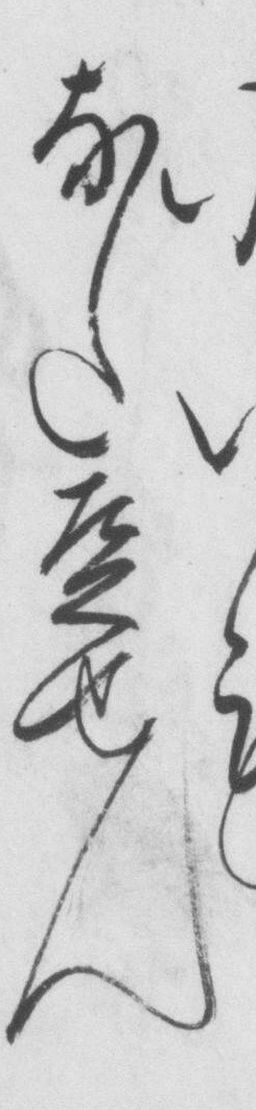なた豆せん

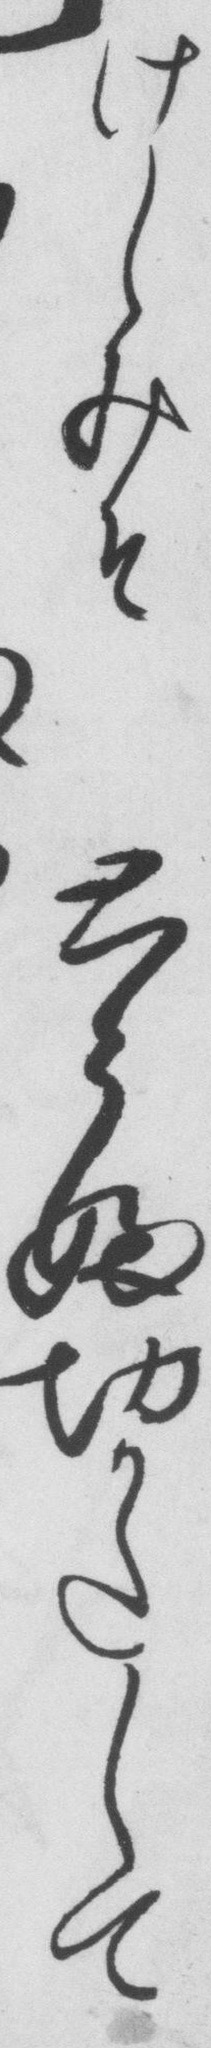けしみそとうふ切かたして
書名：料理筌
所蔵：大阪府立大学学術情報センター 国文学研究資料館
